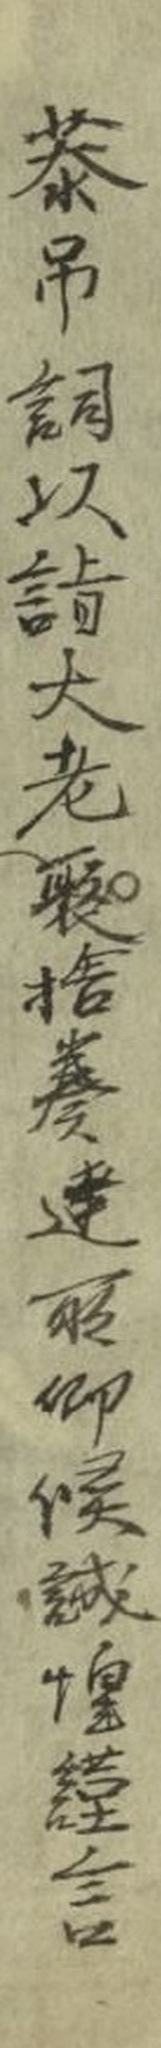恭弔詞以詣大老取捨奏達所仰候誠惶謹言
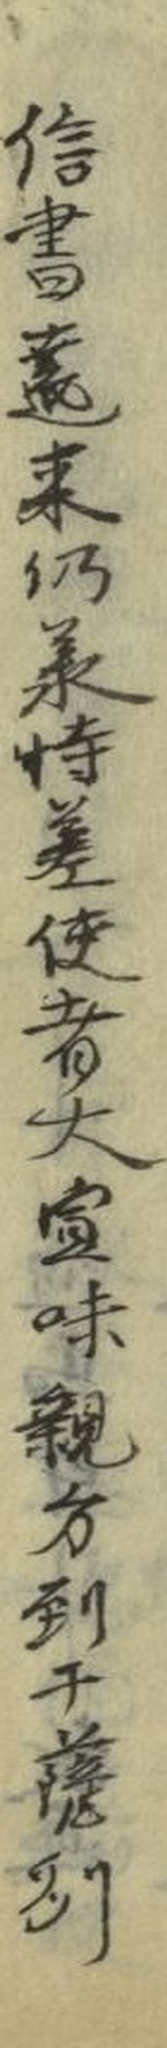信書遠来仍承特差使者大宜親方到于薩州
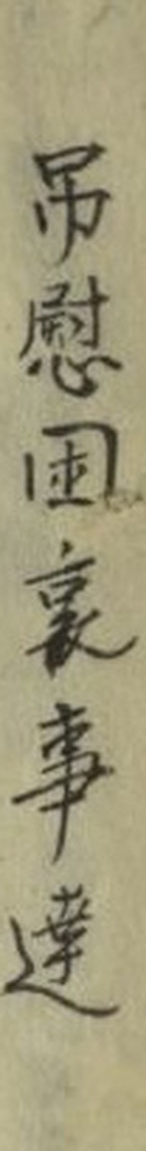弔慰困哀事達
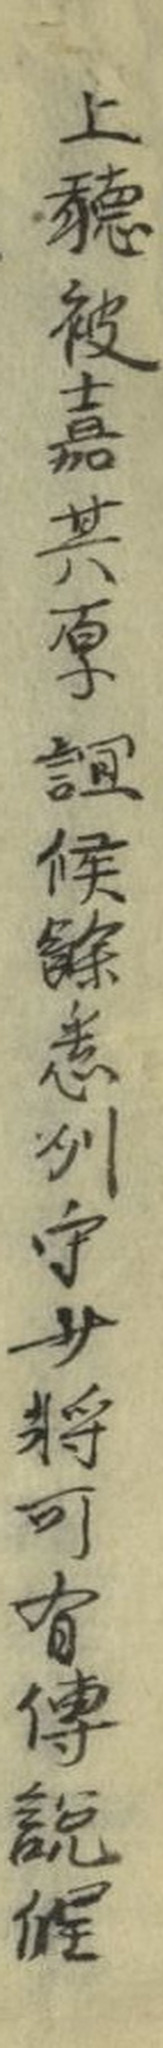上聴被嘉其厚誼候余悉州守少将可有伝説候
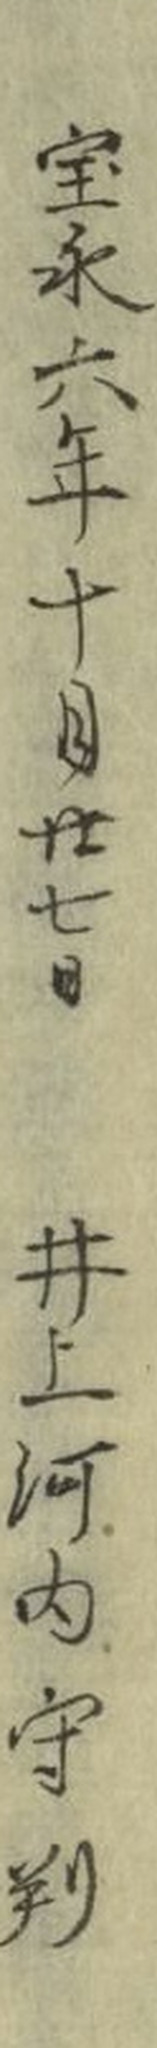宝永六年十月廿七日井上河内守判
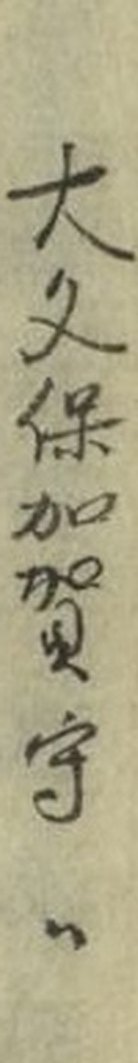大久保加賀守同
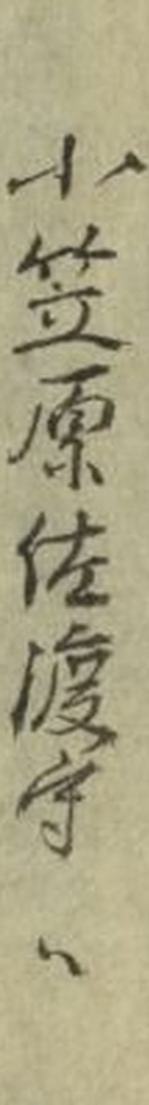小笠原佐渡守同
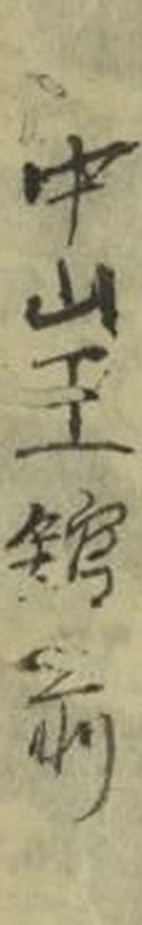中山王館前

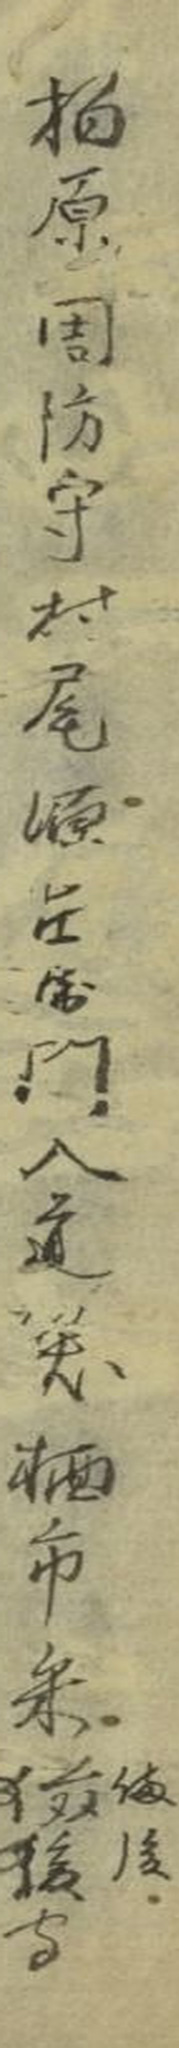柏原周防守村尾源左衛門入道隠栖市朱備後守
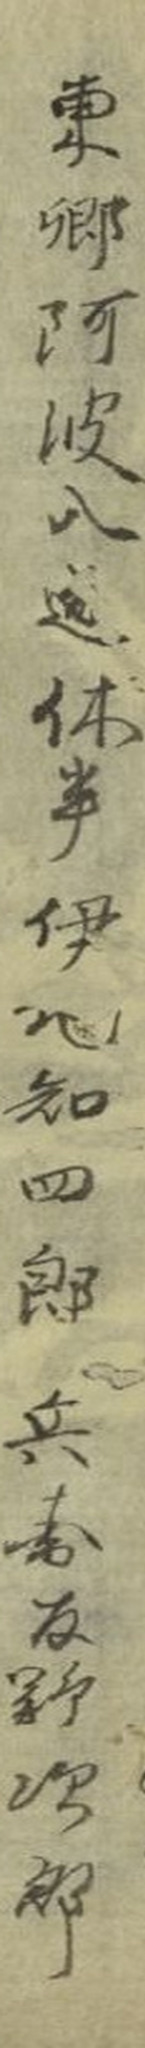東郷阿波入道休半伊地知四郎兵衛友野次郎
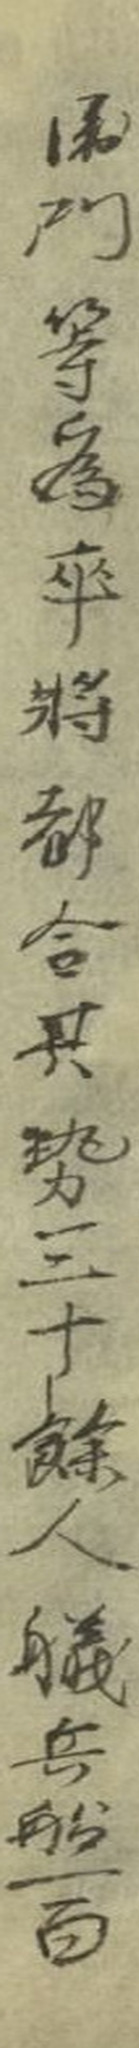衛門等為卒将都合其勢三十余人艤兵船一百
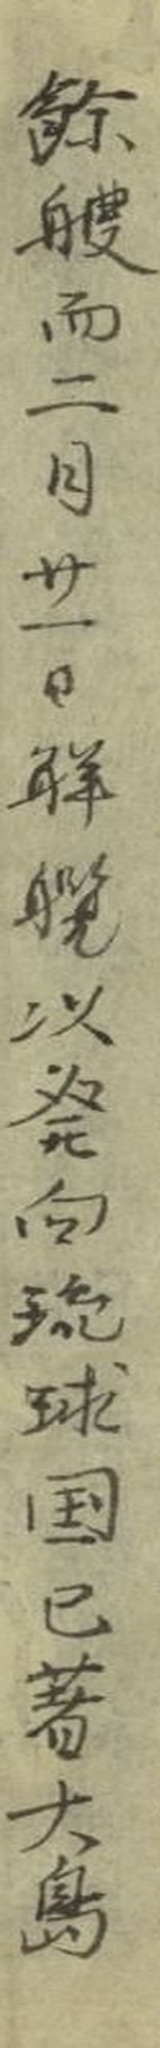余艘而二月廿一日觧纜以発向琉球国已著大島
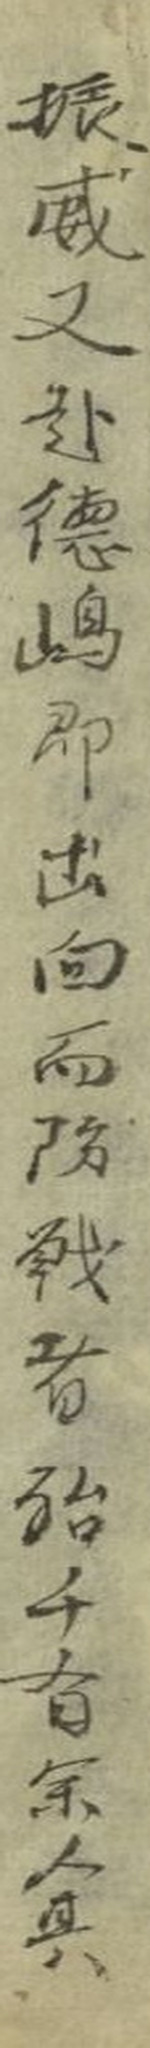振威又赴徳島即出向而防戦者殆千有余人其
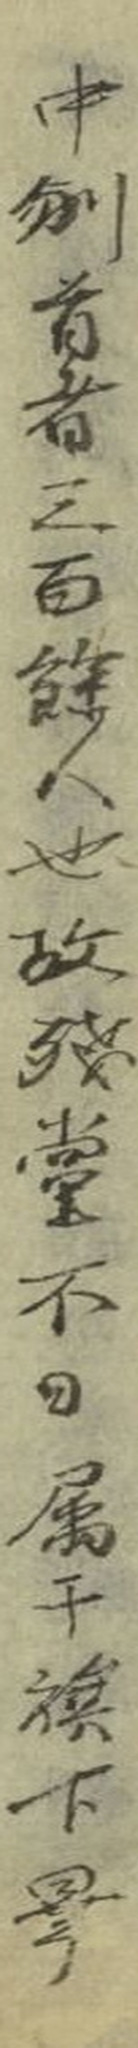中刎首者三百余人也故残党不日属于旗下畢
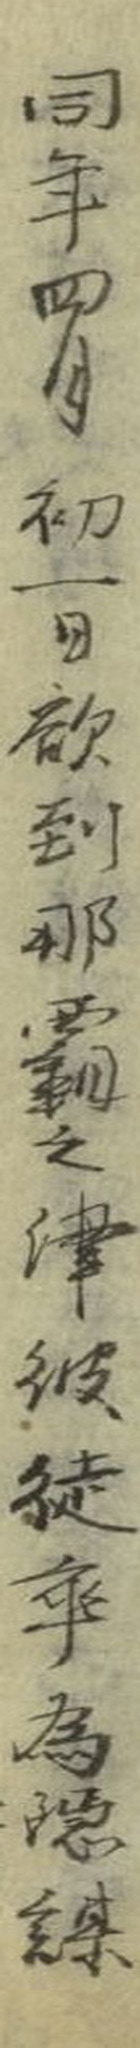同年四月初一日欲到那覇之津彼徒卒為陰謀
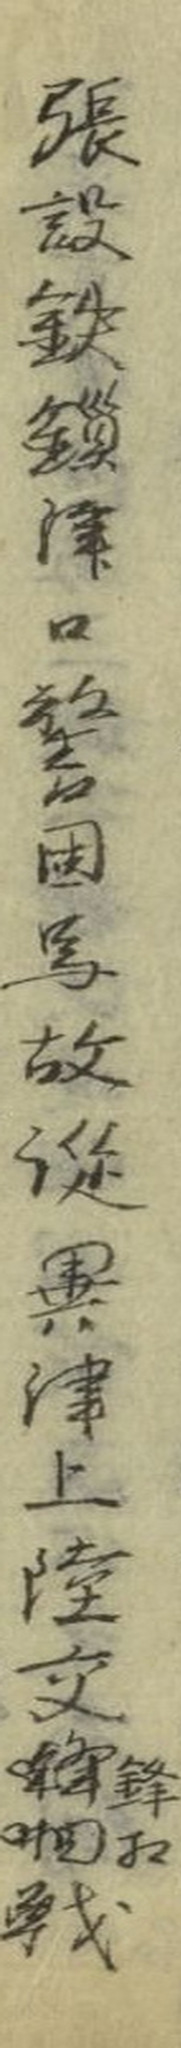張設鉄鎖津口警固焉故従異津上陸交鋒相戦
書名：琉球紀事
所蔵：University of the Ryukyus Library
